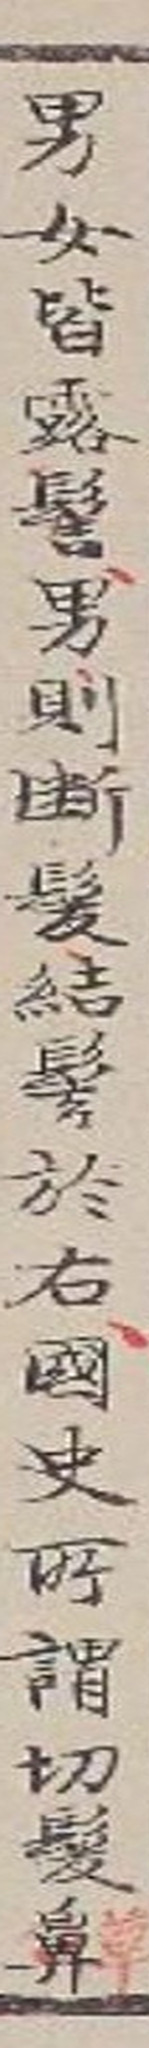男女皆露髻、男則断髪、結髻於右、国史所謂切髪鼻草
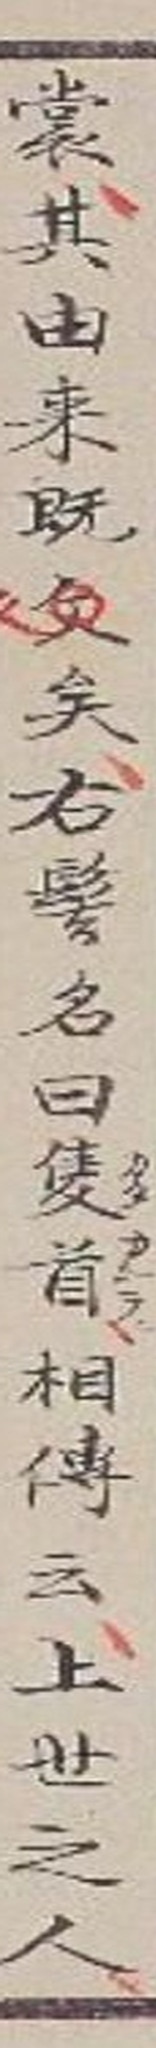裳、其由来既攵久矣、右髻名曰隻首、相伝云、上世之人、
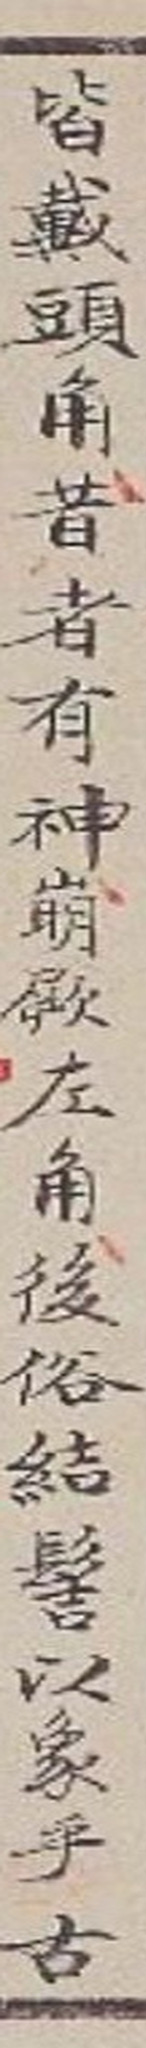皆戴頭角、昔者有神崩厥左角、後俗結髻以象乎古
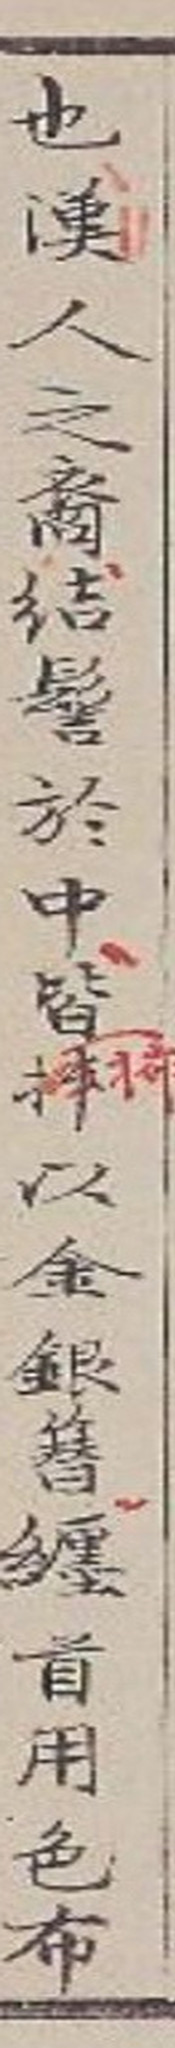也、漢人之裔、結髻於中、皆揷以金銀簪、纏首用色布
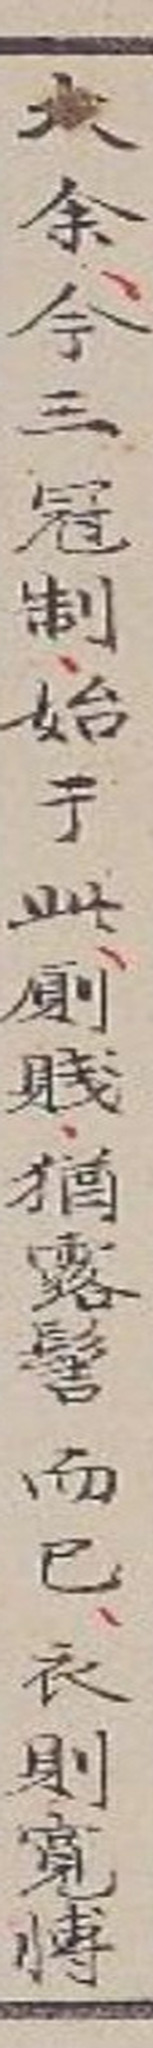余、今三冠制、始于此、厠賤猶露髻而已、衣則寛博
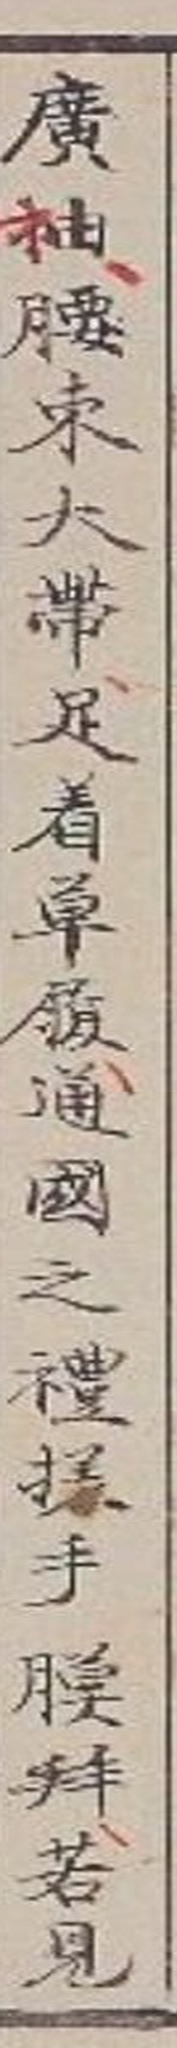広袖、腰束大帯、足着草履、通国之礼搓手膜拝、若見
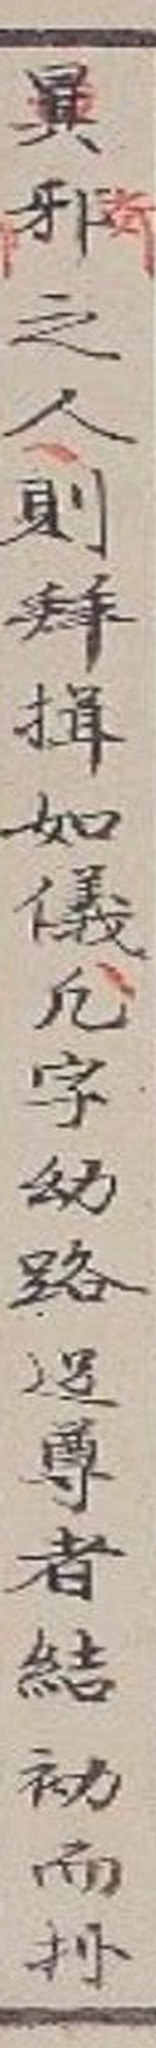異邪邦之人、則拝揖如儀、凡字幼路尊者結初而掛

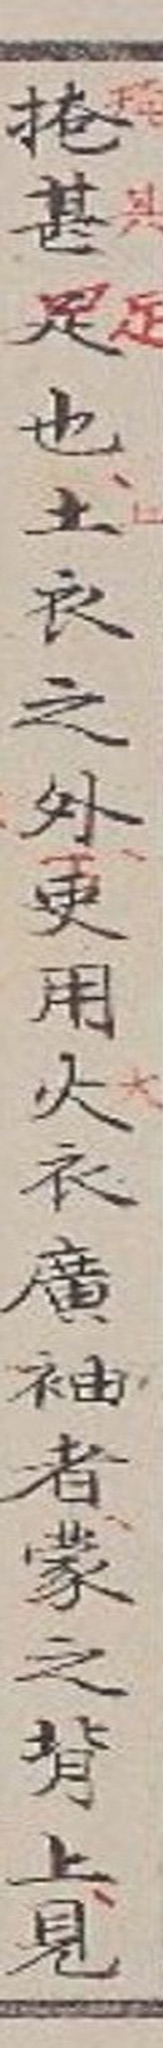掩甚其疋足也、土上衣之外、更用火大衣広袖者、蒙之背上、見
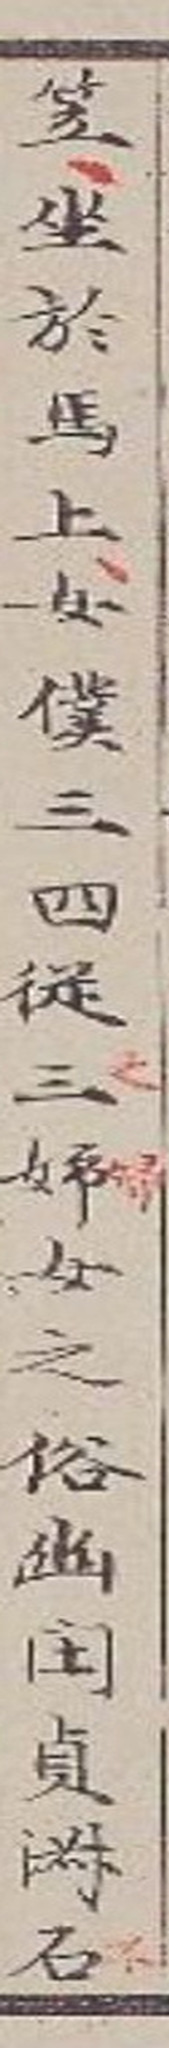笠、坐於馬上、女僕三四従三之婦女之俗幽貞淑石不
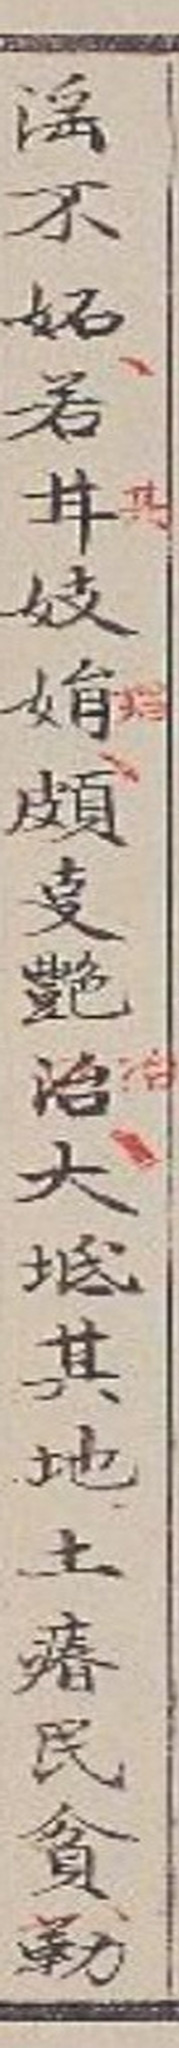滛不妬、若其妓娟娼、頗事艶冶治、大抵其地土瘠民貧、勤
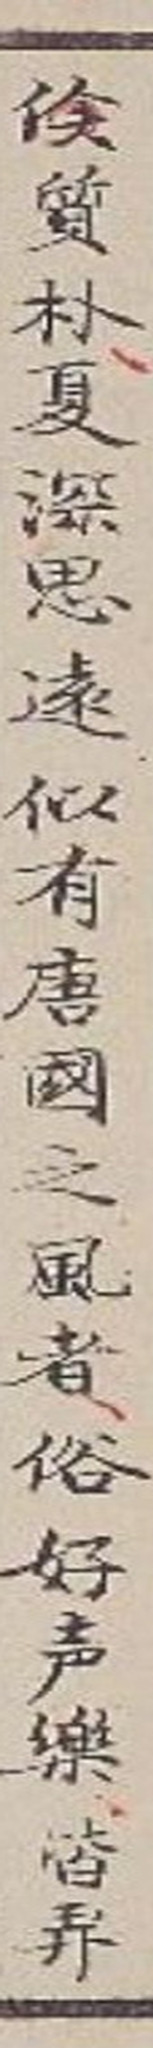倹質朴、夏深思遠似有唐国之風者、俗好声楽、皆弄
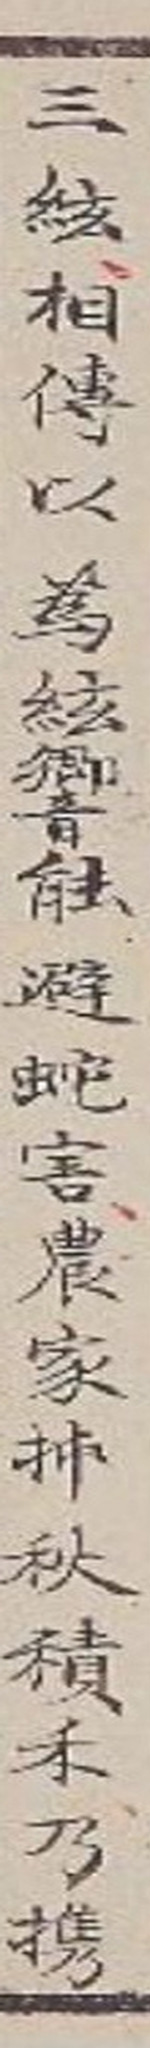三絃、相伝以為絃響能避蛇害、農家揷秋積禾、乃携
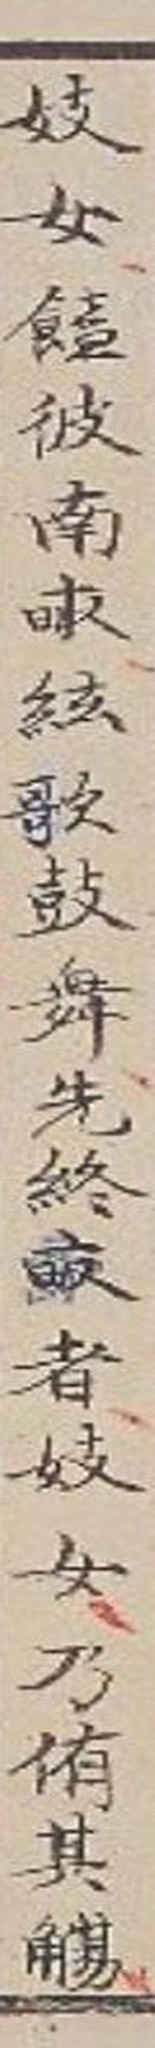妓女、饁彼南畞、絃歌鼓舞、先終畞者、妓女、乃侑其觴、
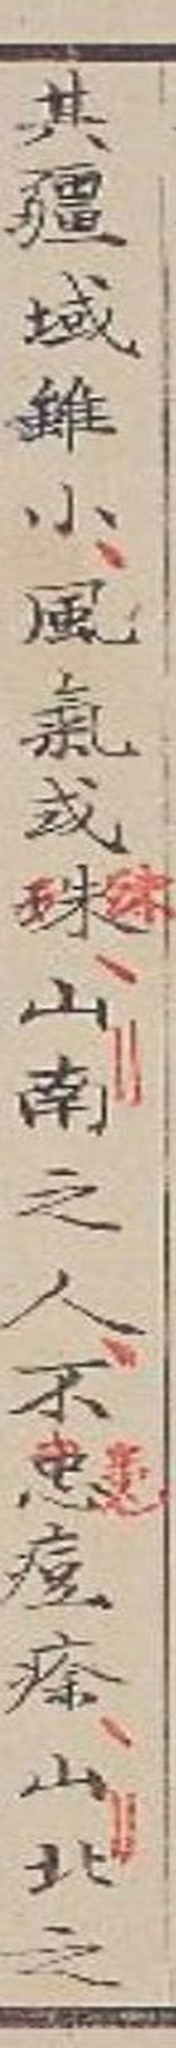其疆域雖小、風気或珠殊、山南之人、不忠患痘、山北之
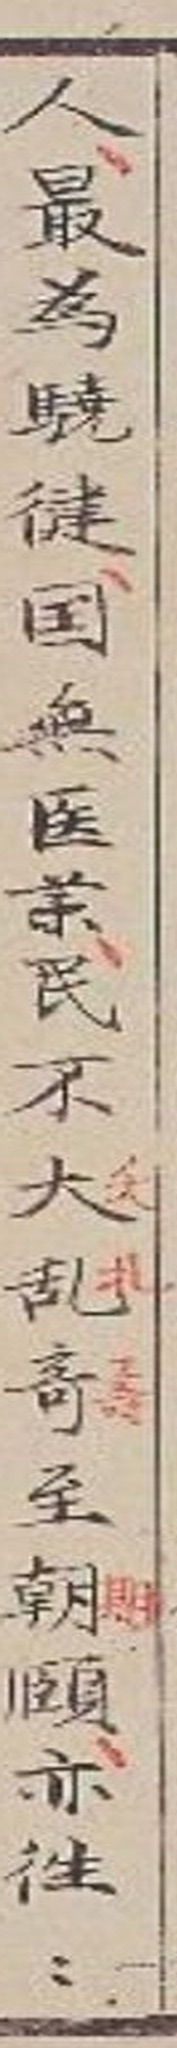人、最為驍健、国無医業、民不大夭乱扎奇寿至朝期頤、亦往々
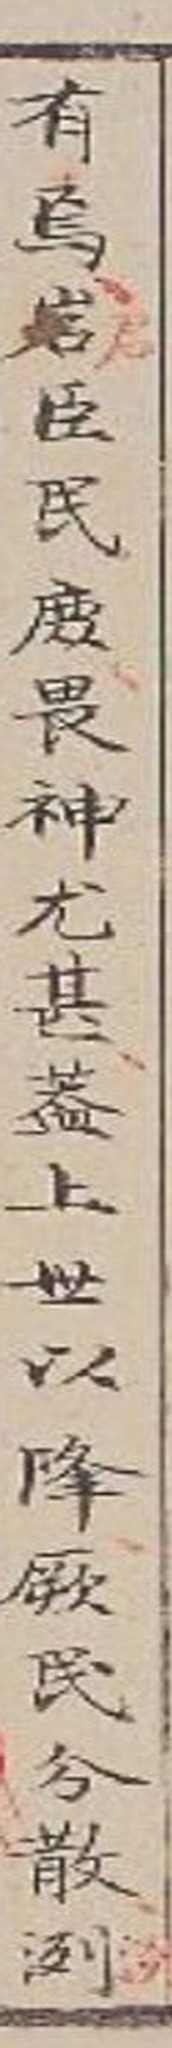有焉、岩君臣民庶、畏神尤甚、蓋上世以降、厥民分散洌
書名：南島志 全
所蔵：University of the Ryukyus Library
